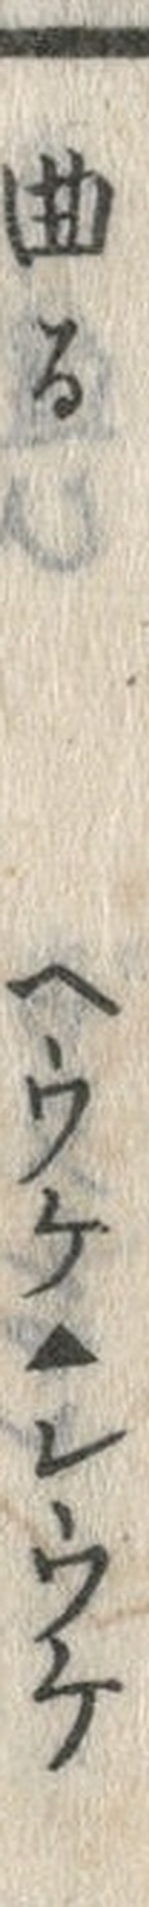曲るヘウケ▲レウケ

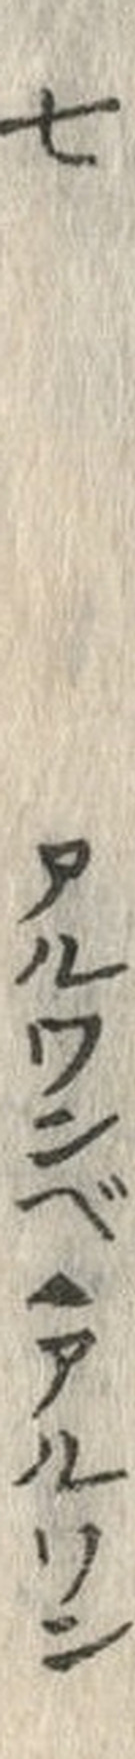七アルワンベ▲アルワン
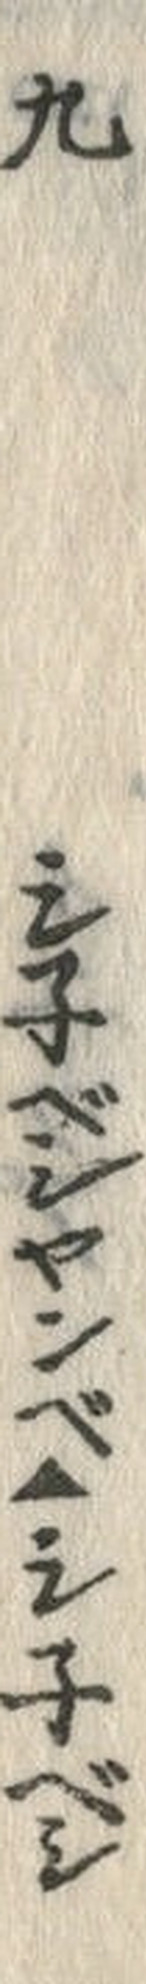九シネベシヤンベ▲シネベシ
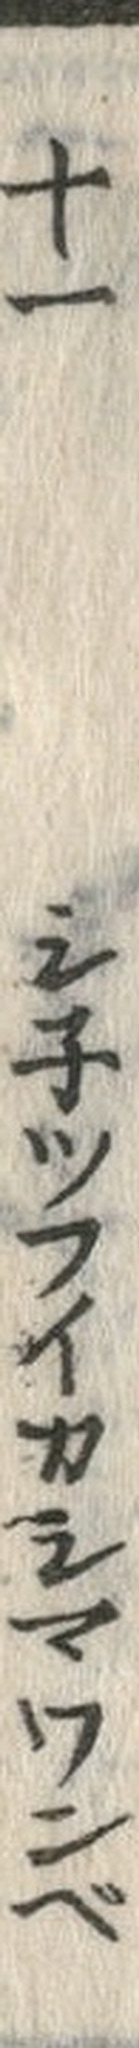十一シネツフイカシマワンベ
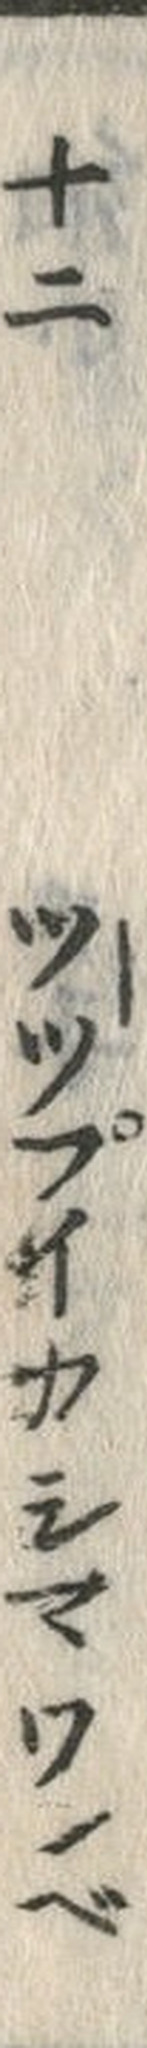十二ツツプイカシマワンベ
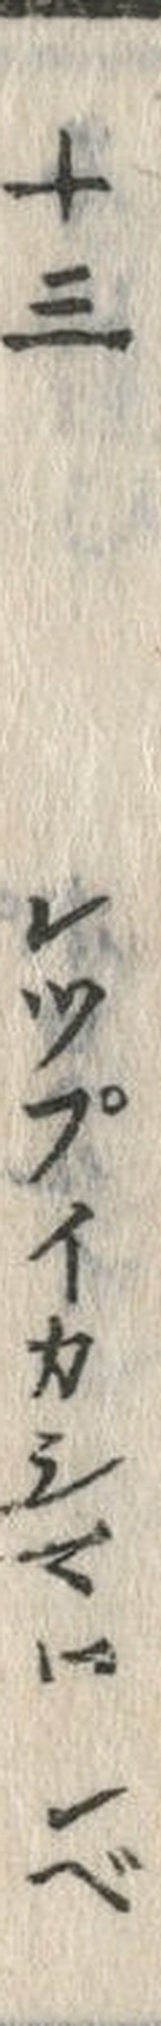十三レツプイカシマワンベ
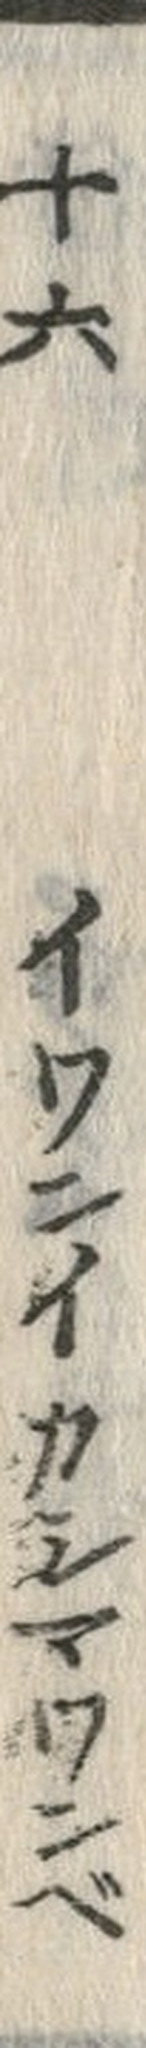十六イワンイカシマワンベ
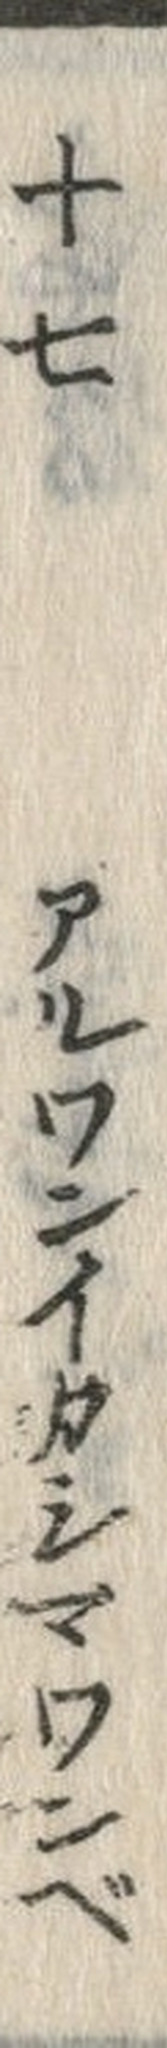十七アルワンイカシマワンベ
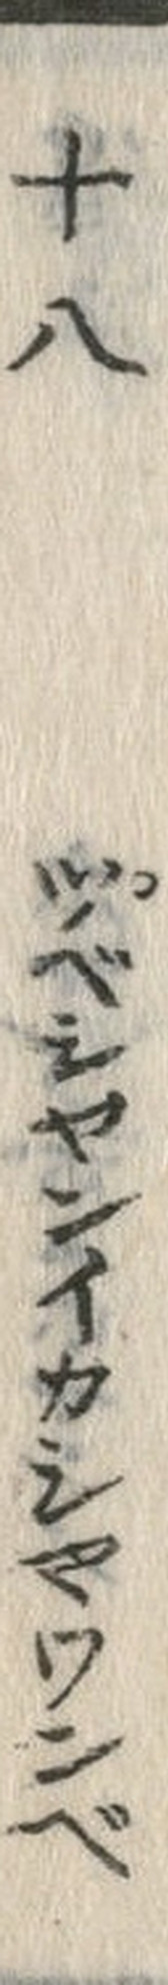十八ツ゚ベシヤンイカシマワンベ
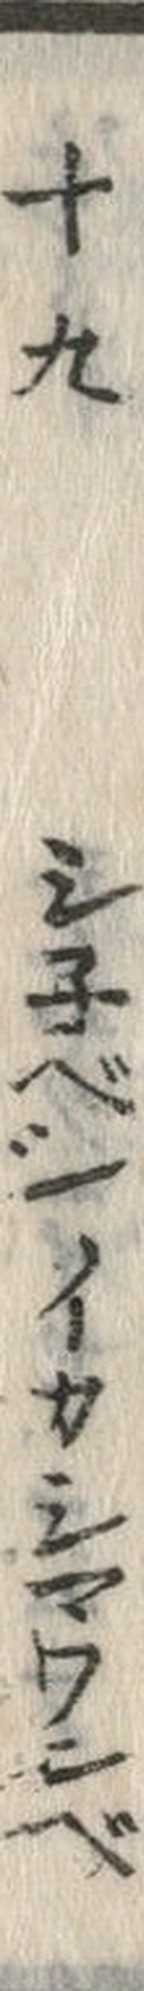十九シネベシイカシマワンベ
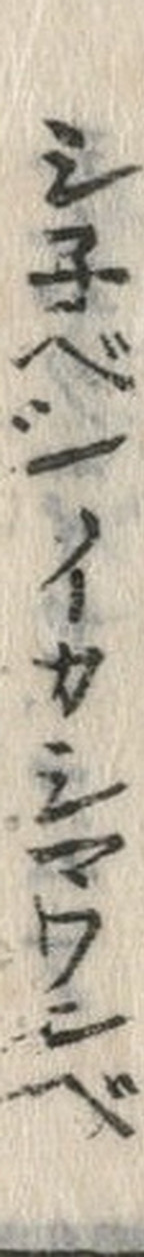十九シネベシイカシマワンベ

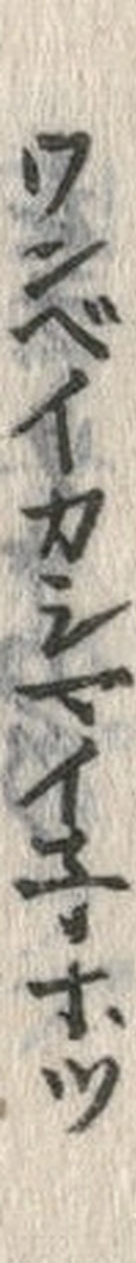九十ワンベイカシマイネホツ
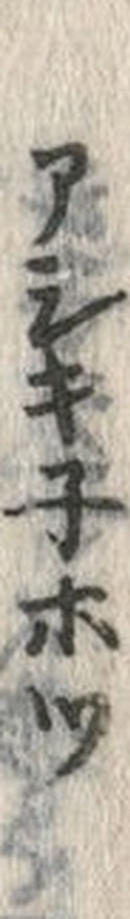百アシキネホツ

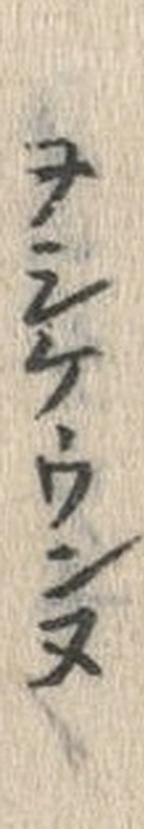方ヲシケウンヌ
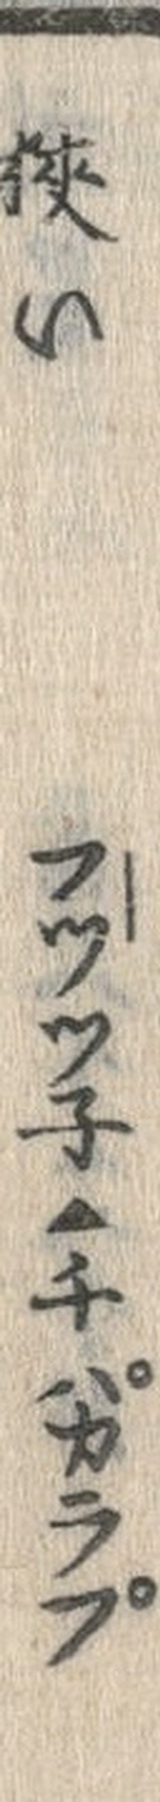狭いフツツネ▲チパカラプ
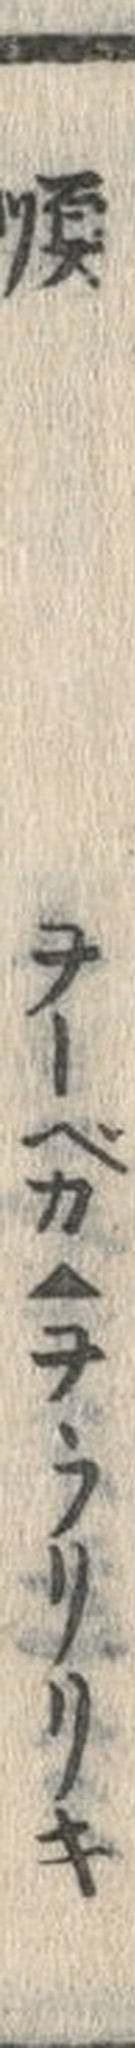順ヲーベカ▲ヲラリリキ
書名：蝦夷方言藻汐草　坤巻
